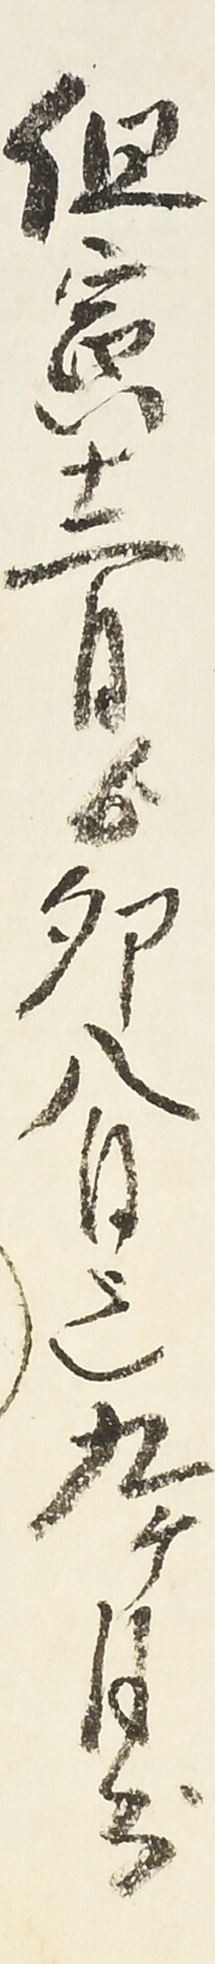但寅十二月ゟ卯八月迄九ヶ月分
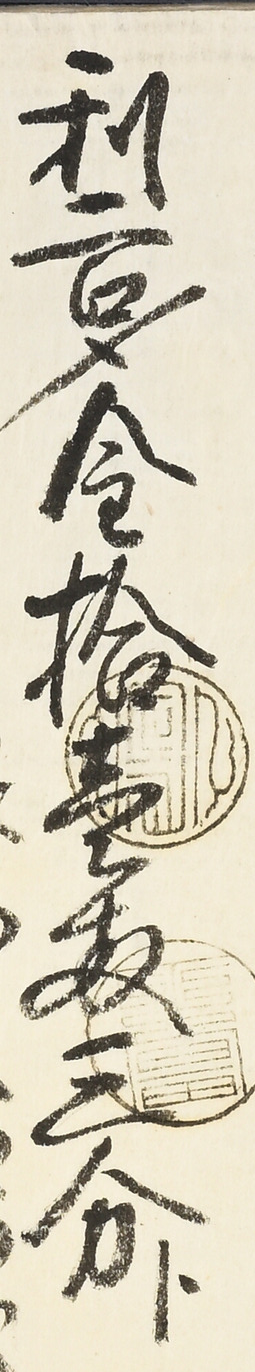利二口〆金拾壱両三分ト
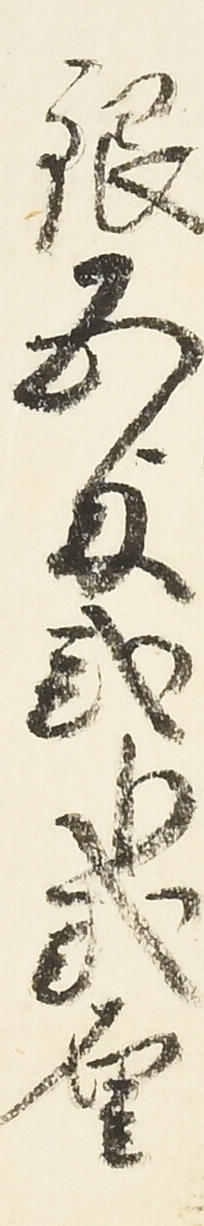銀五匁弐分弐厘
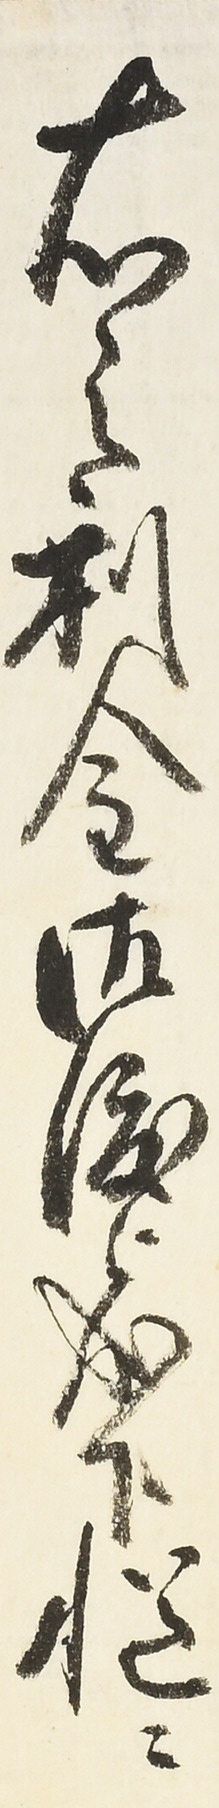右之利金御渡被成下慥ニ
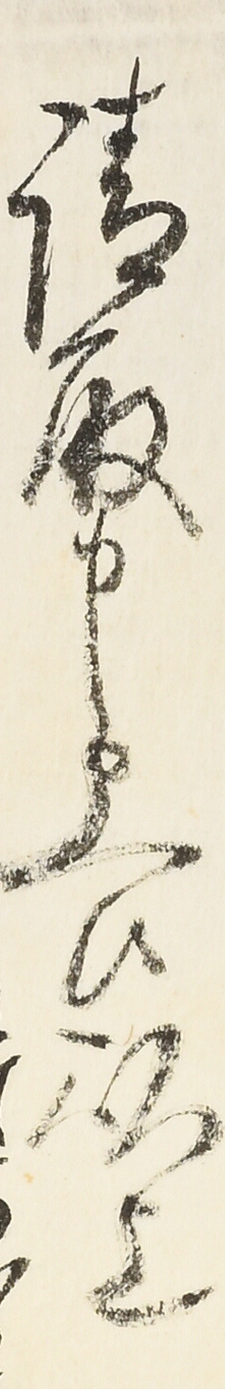請取申上候以上
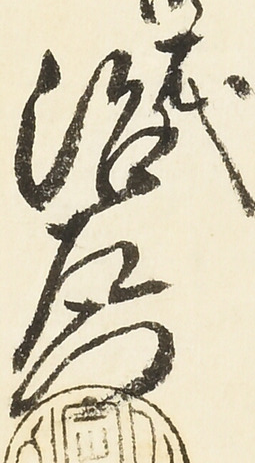治左衛門
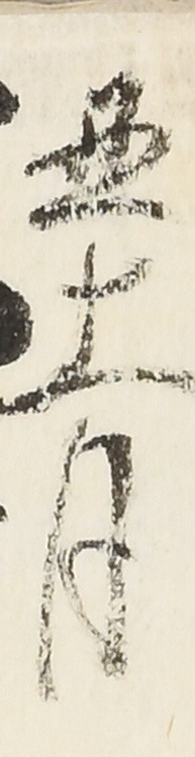丑十一月
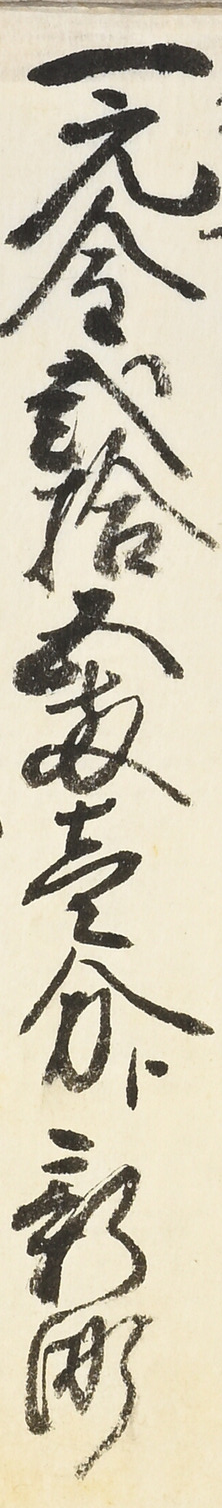一元金弐拾五両壱分ト新町
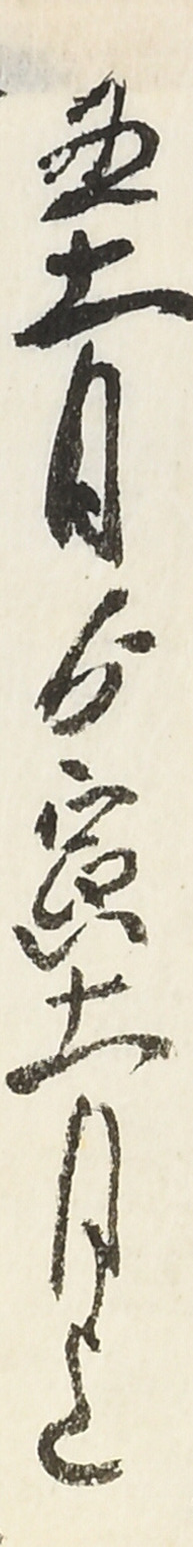丑十一月ゟ寅十一月迄
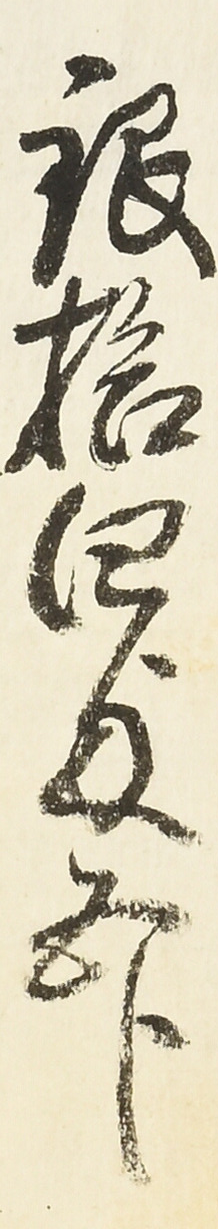銀拾四匁五分
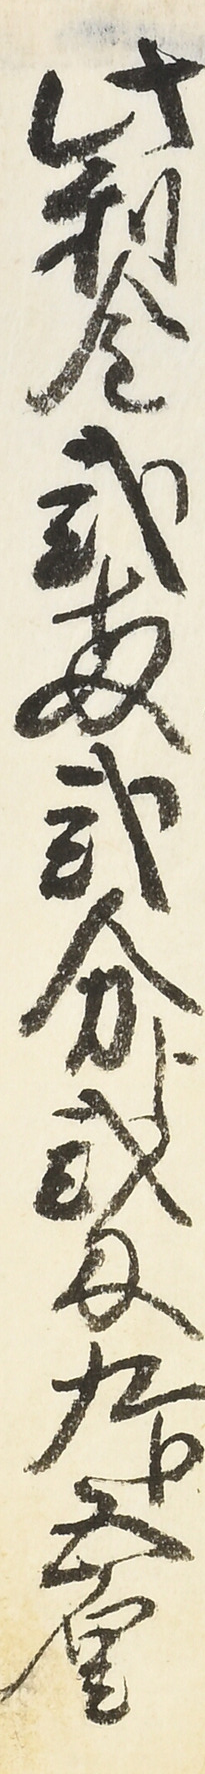此利金弐両弐分ト弐匁九分五厘
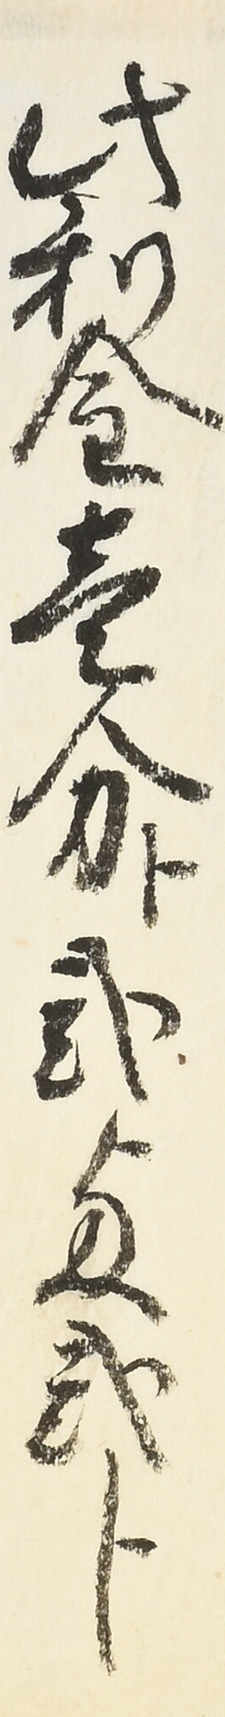此利金壱分ト弐匁弐分
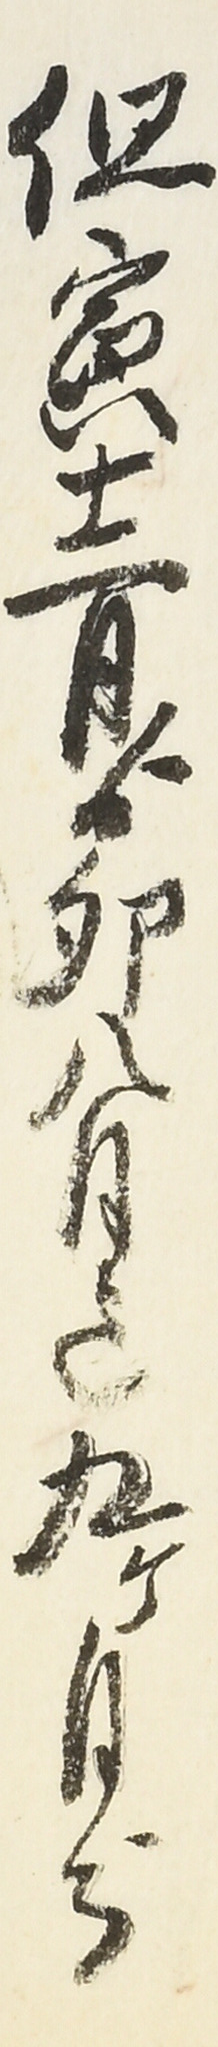但寅十二月ゟ卯八月迄九ヶ月分
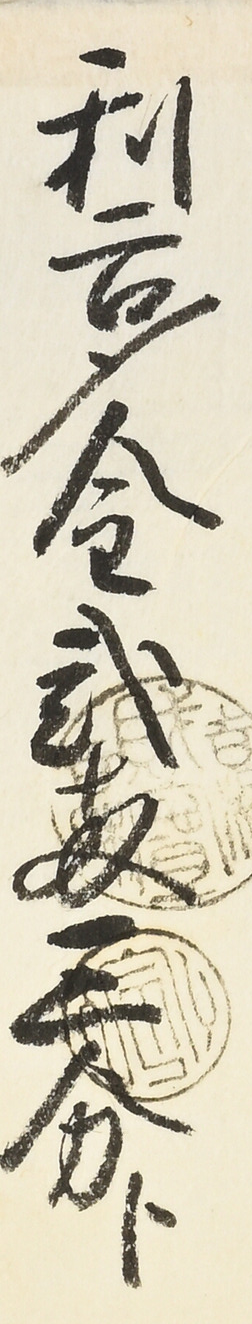利二口〆金弐両三分ト
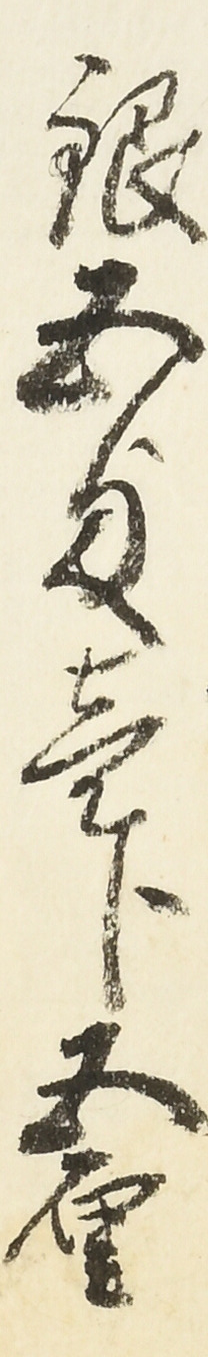銀五匁壱分五厘
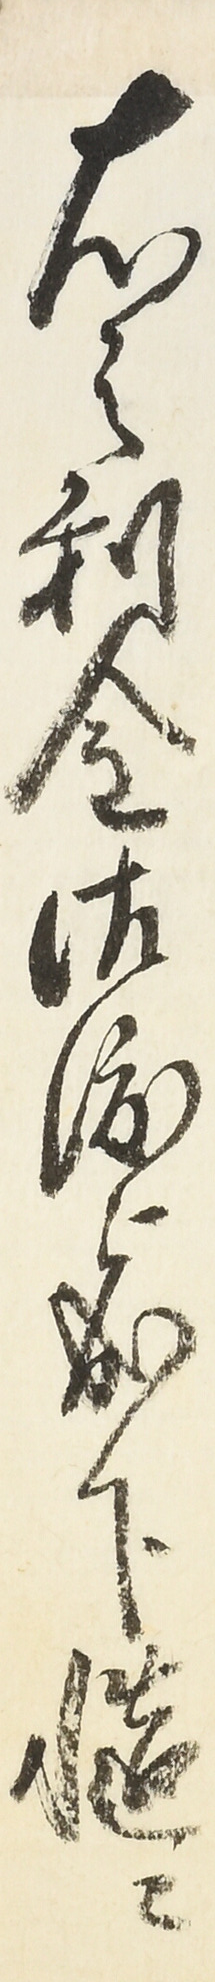右之利金御渡被成下慥ニ
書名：御才覚金御利足割渡扣帳
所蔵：伊那市立高遠町図書館・合同会社AMANE
